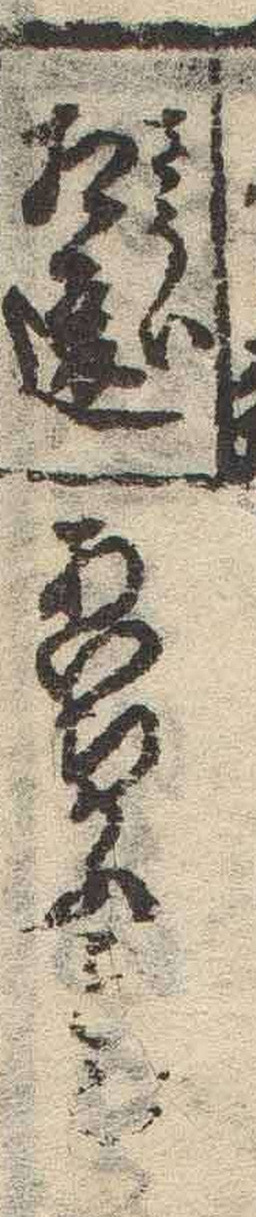相違あいちかふこと也
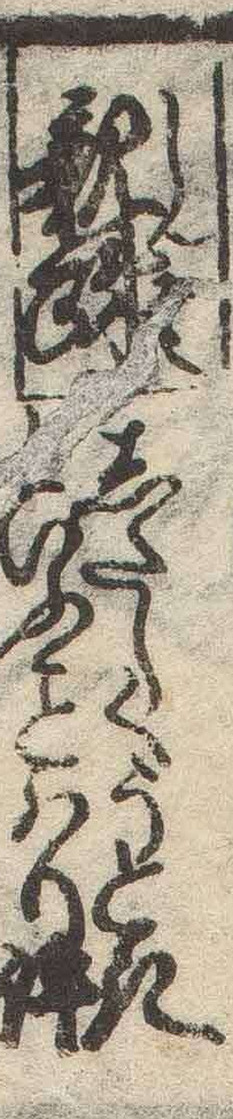親疎したしくうとき
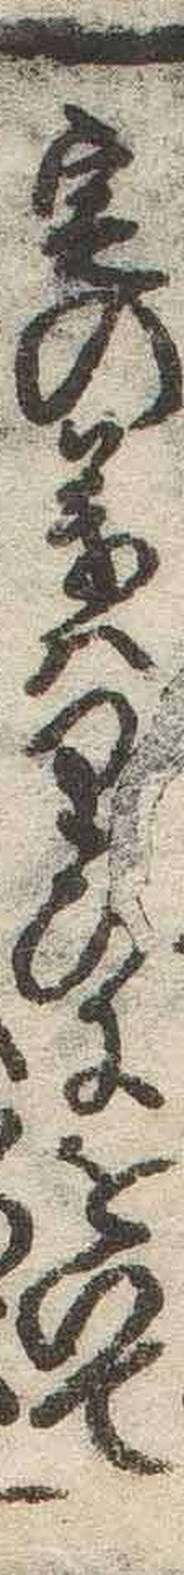定の義はりひにをいて
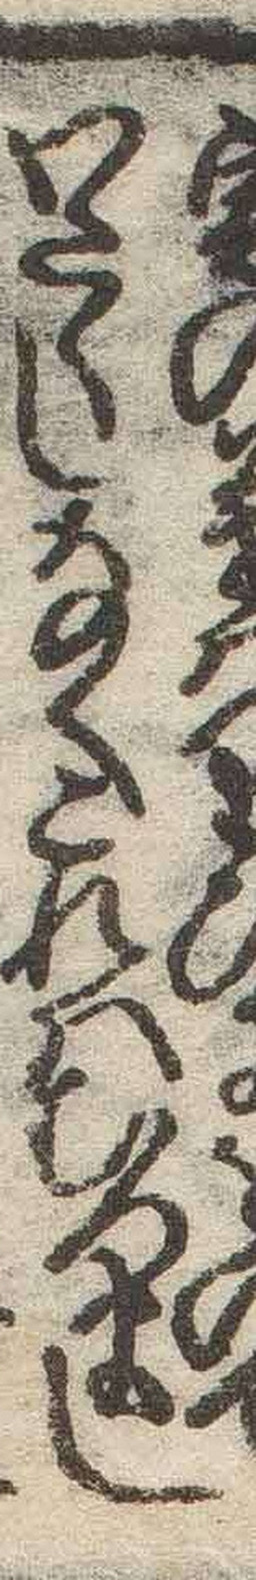わたくしなくこれはむつまし
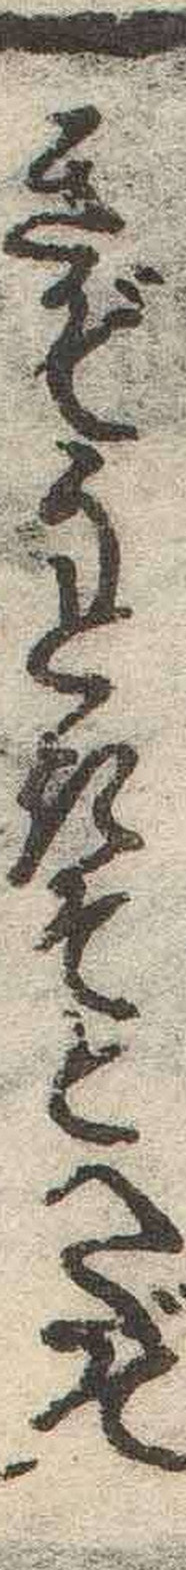きぞうときそとへだて
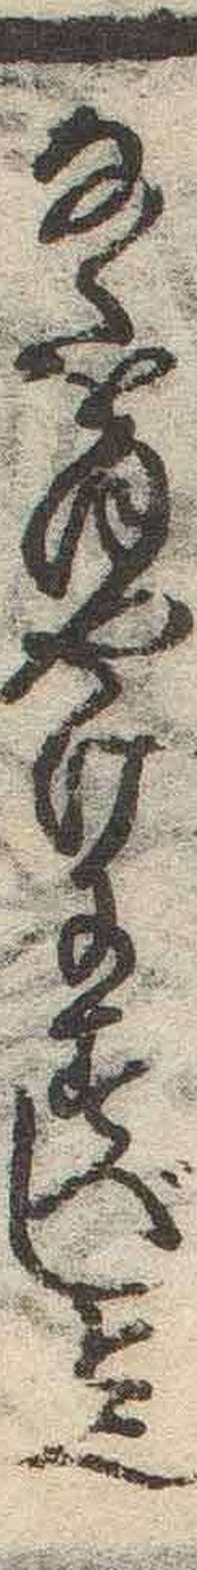なくをほやけにすべしと也
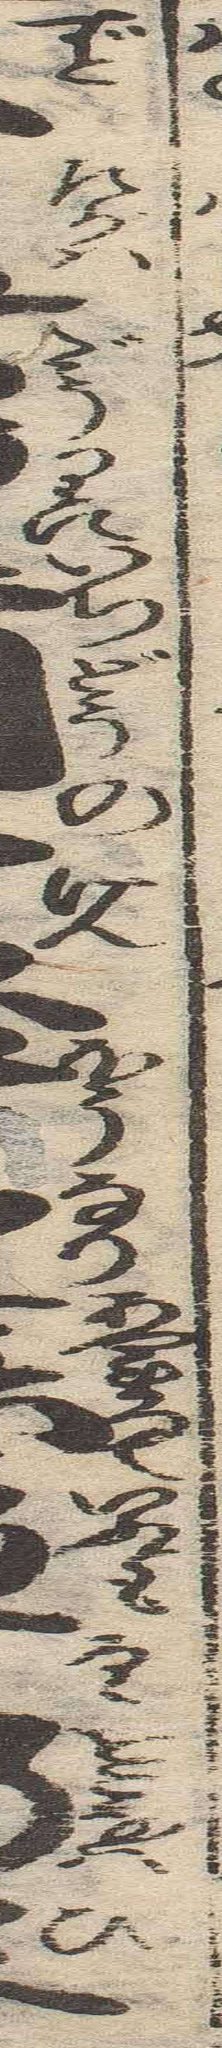ずとたかはだうりにいちどうのけんほうなりあやまつていふともるゝをこなはひ
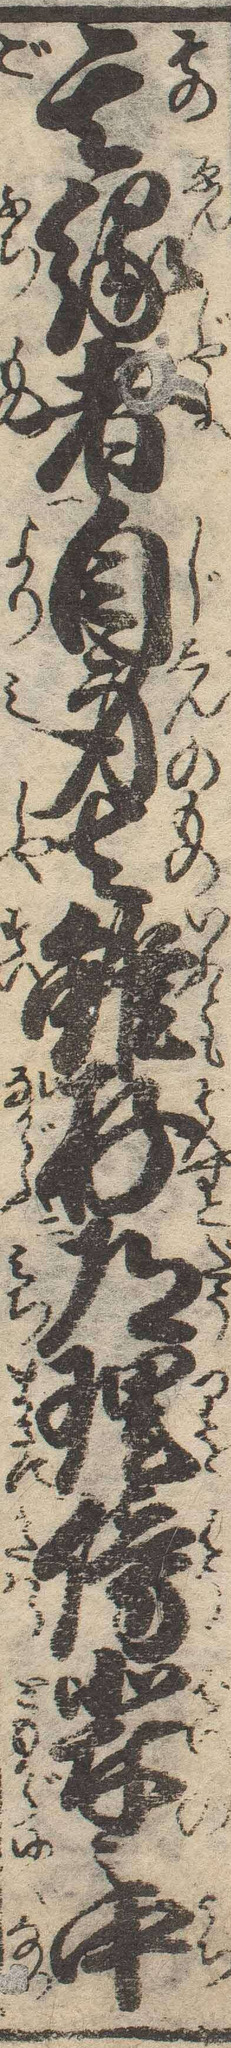其縁者自身者雖存道理傍輩之中
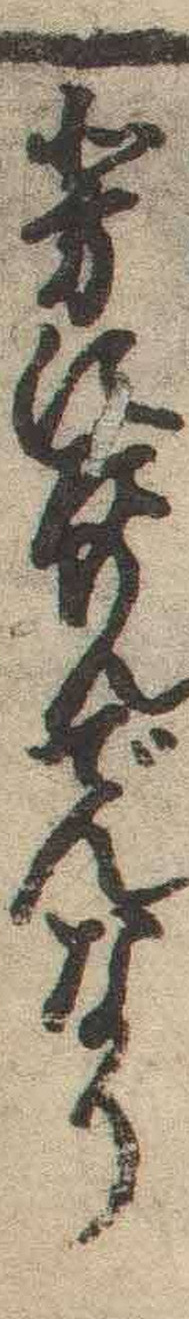北方にたもんでんなり

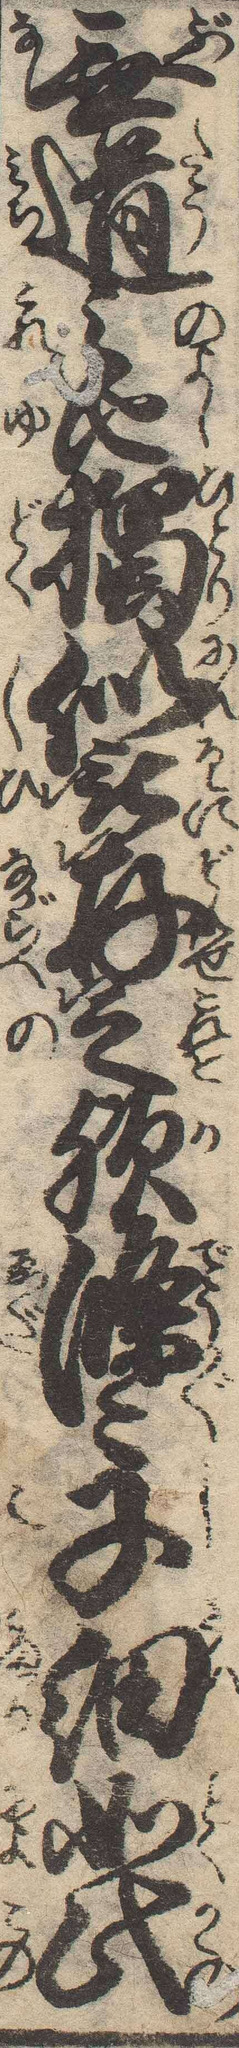無道之由獨似被存之欤條々子細如此
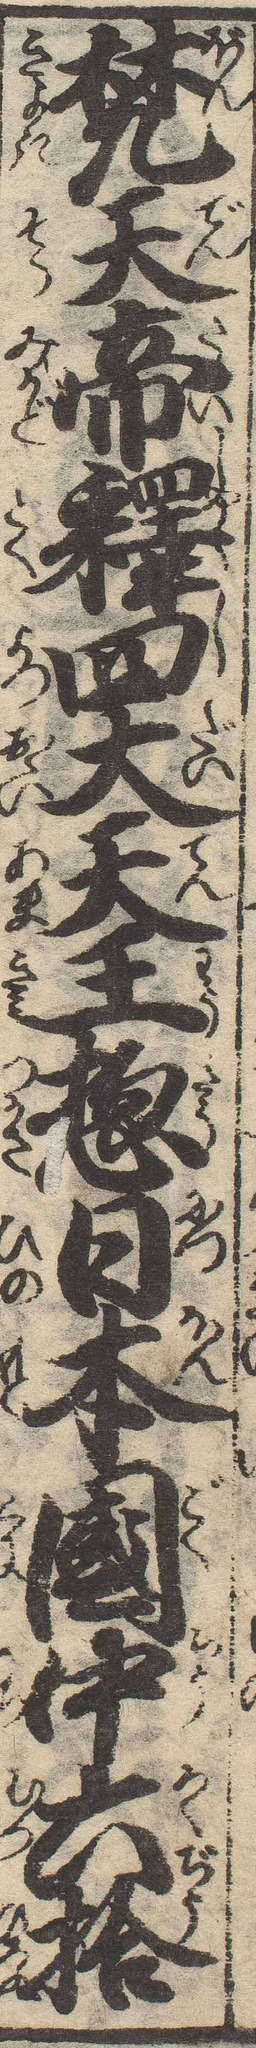梵天帝釋四大天王惣日本國中六拾
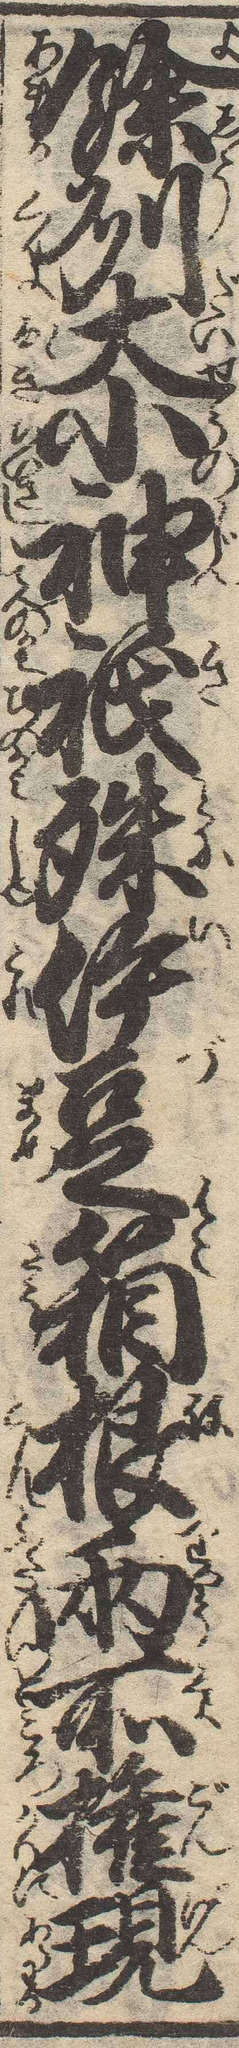餘州大小神祇殊伊豆箱根兩所権現
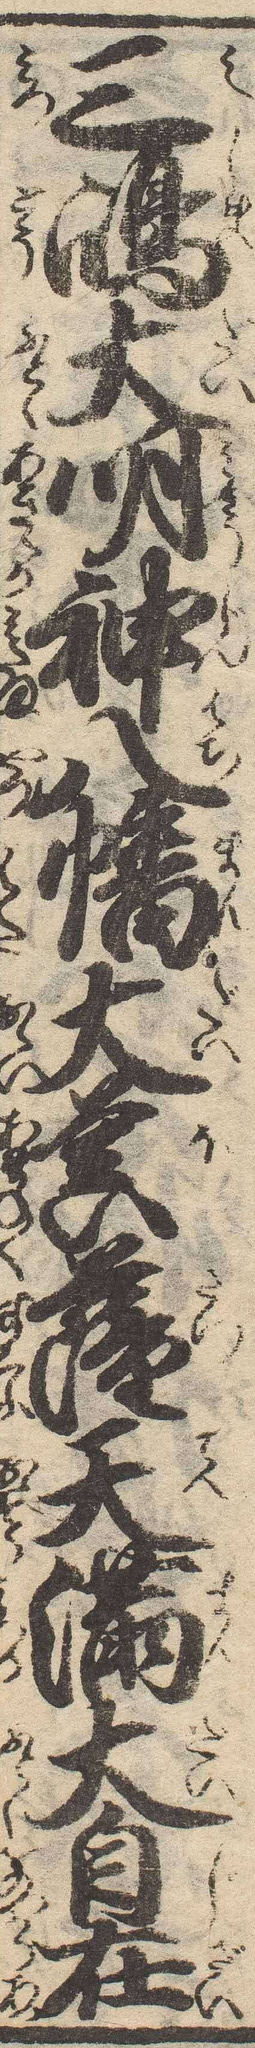三嶋大明神八幡大菩薩天満大自在
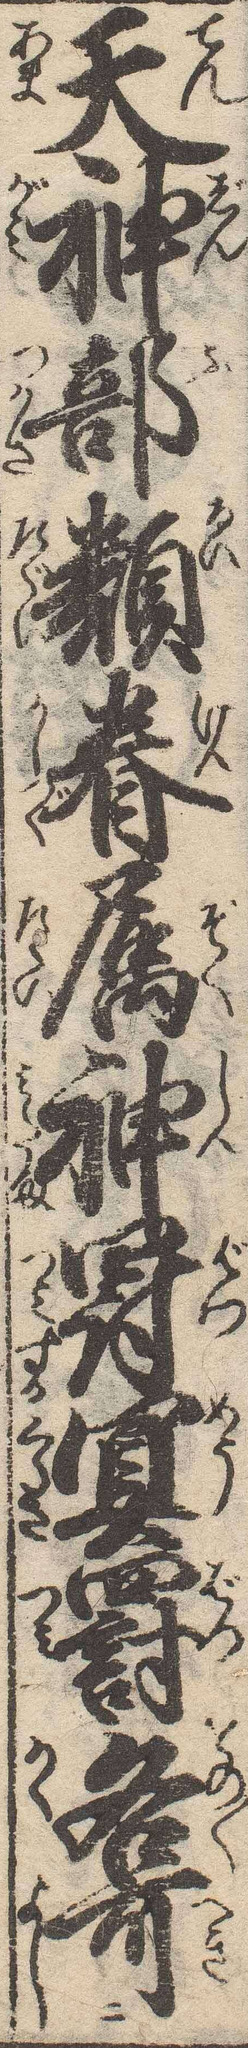天神部類眷属神罰冥罰各可
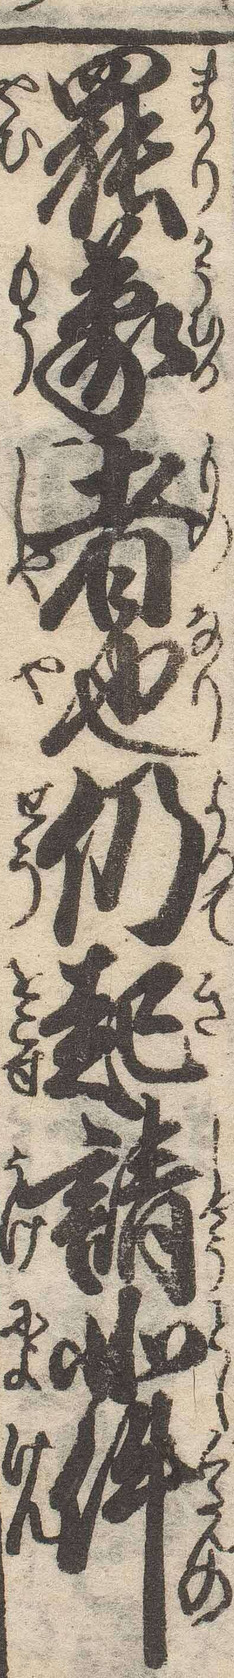罷蒙者也仍起請如件
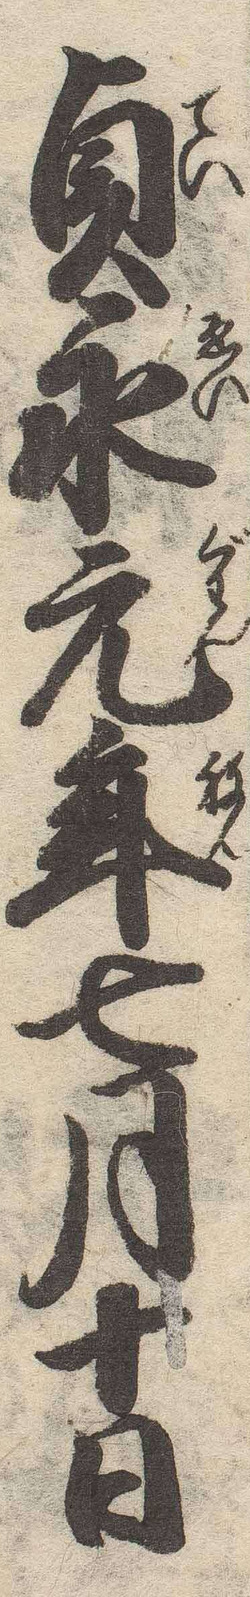貞永元年七月十日
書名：御成敗式目絵抄
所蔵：東京学芸大学附属図書館 国文学研究資料館
